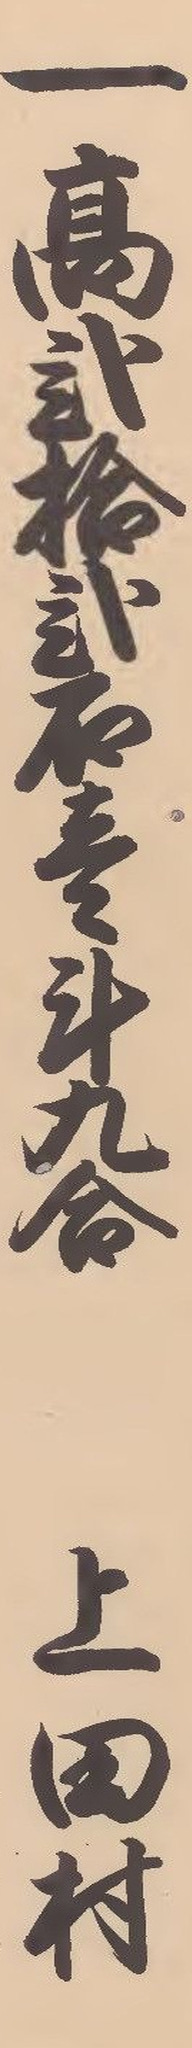一高弐拾弐石壱斗九合上田村
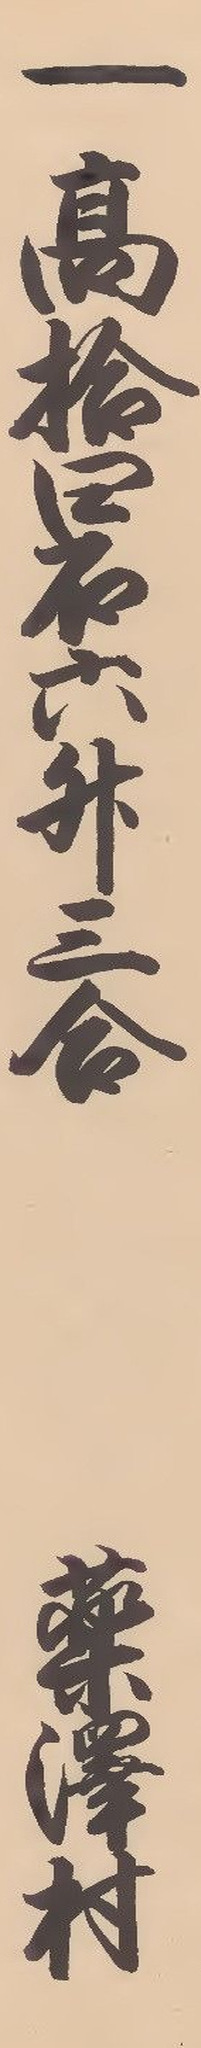一高拾四石六升三合薬沢村
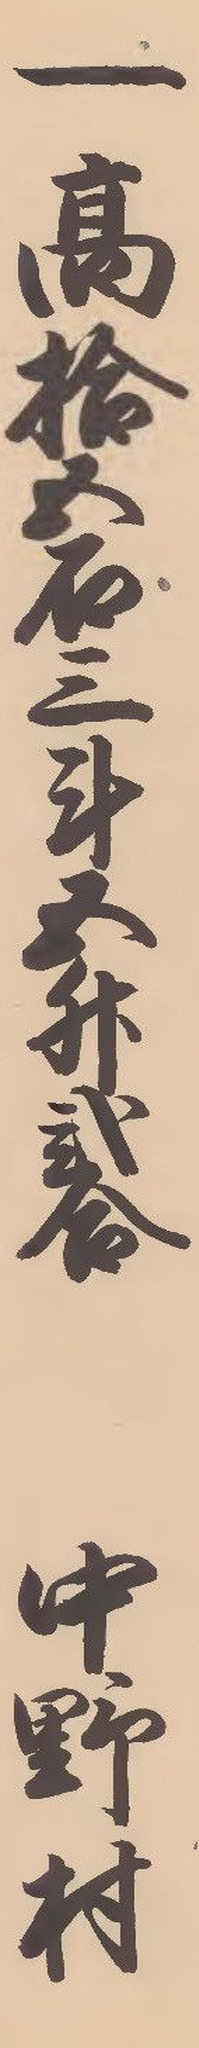一高拾五石三斗五升弐合中野村
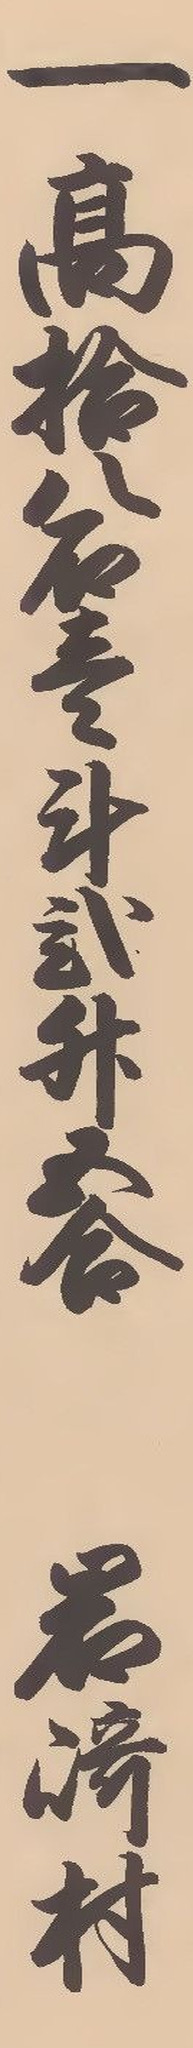一高拾八石壱斗弐升五合岩崎村
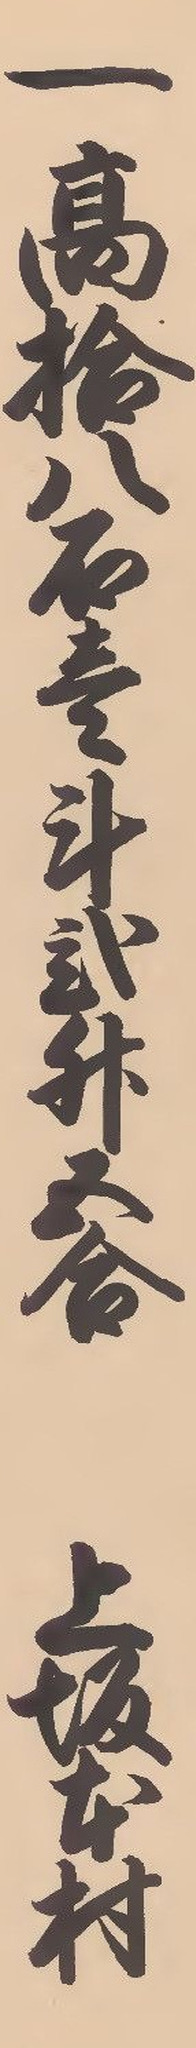一高拾八石壱斗弐升五合上坂本村
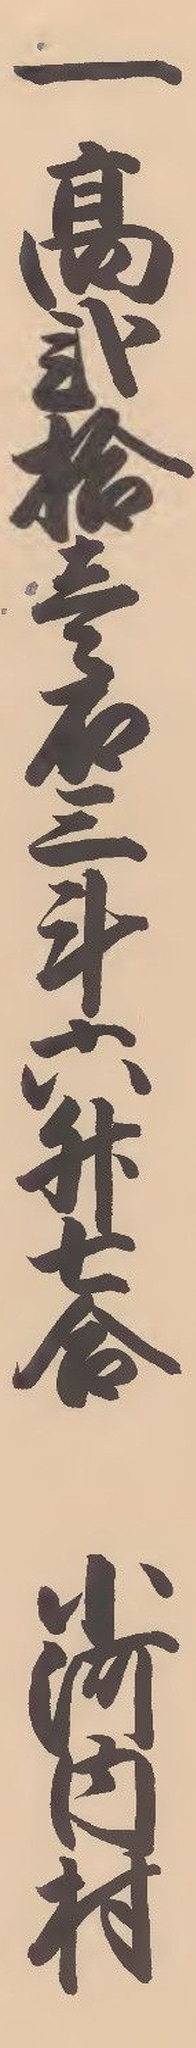一高弐拾壱石三斗六升七合小河内村
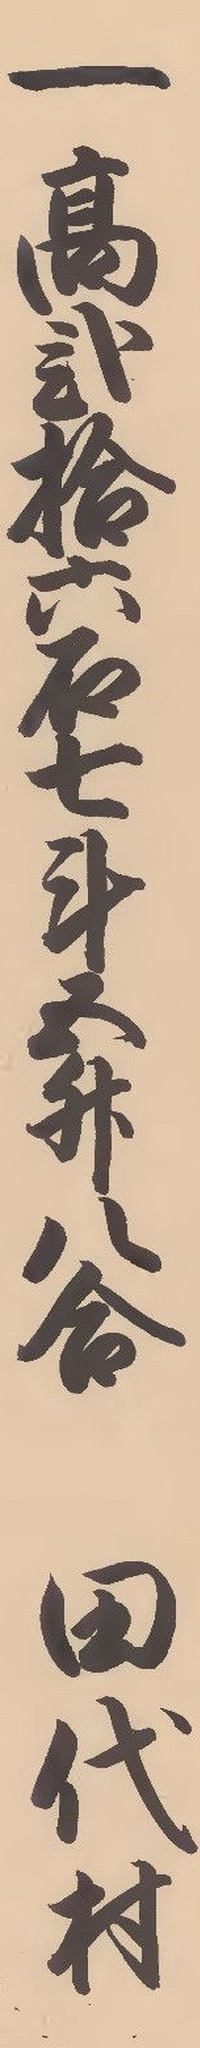一高弐拾六石七斗五升八合田代村
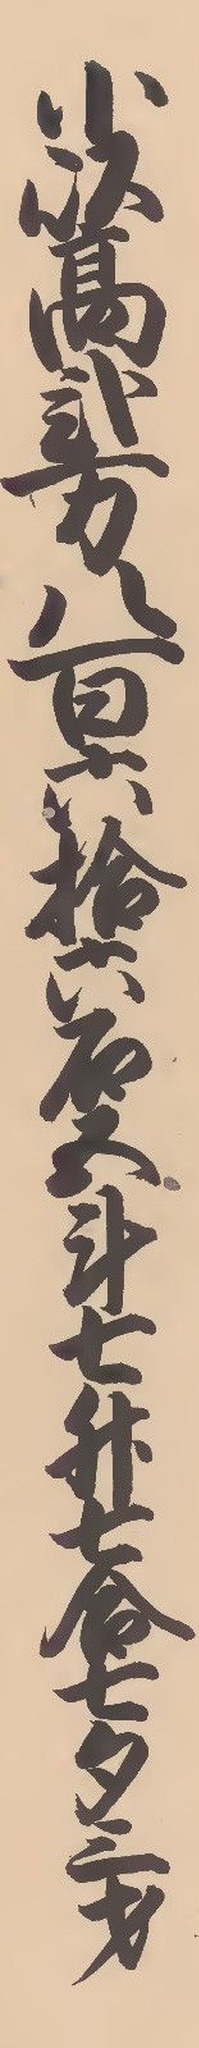小以高弐万八百六拾六石五斗七升七合七勺三才

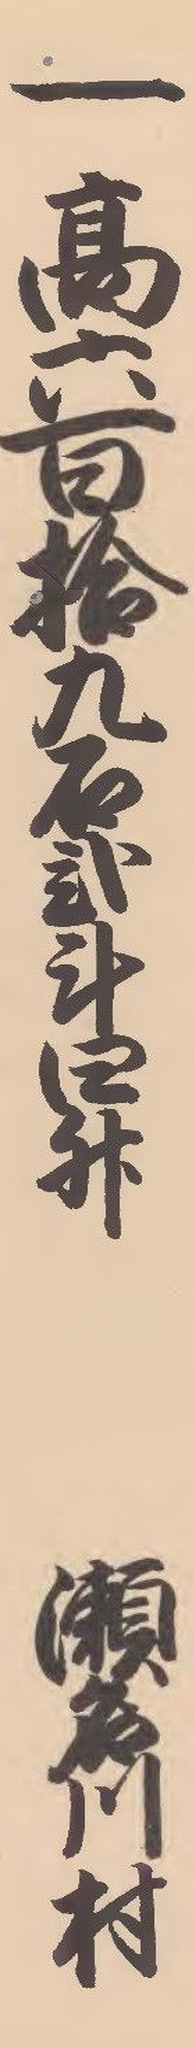一高六百拾九石弐斗四升瀬名川村
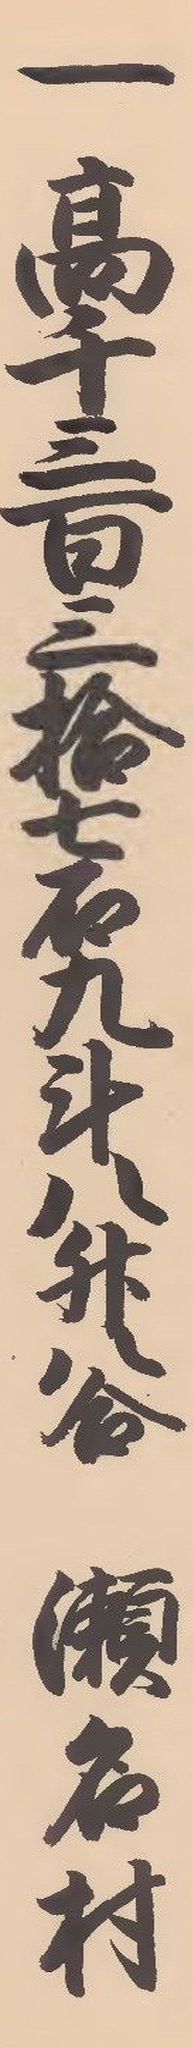一高千三百三拾七石九斗八升八合瀬名村
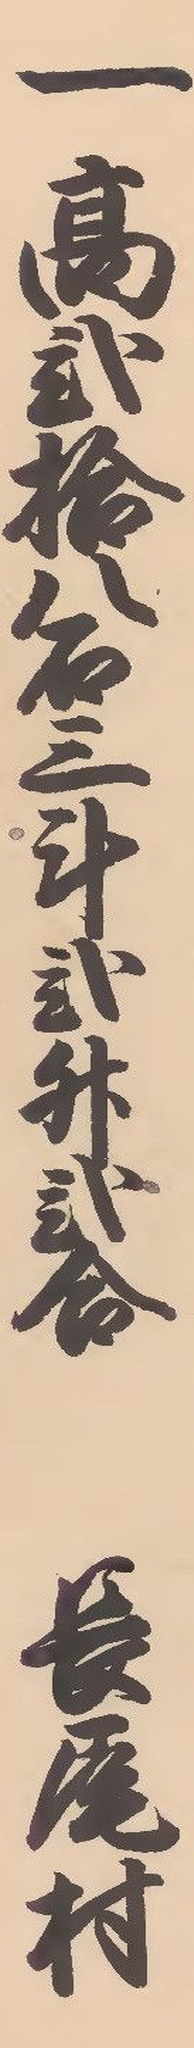一高弐拾八石三斗弐升弐合長尾村

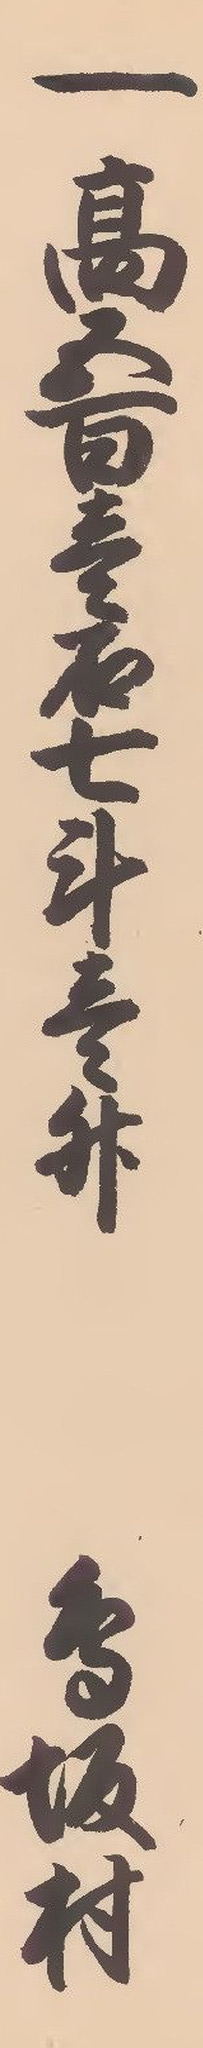一高五百壱石七斗壱升鳥坂村
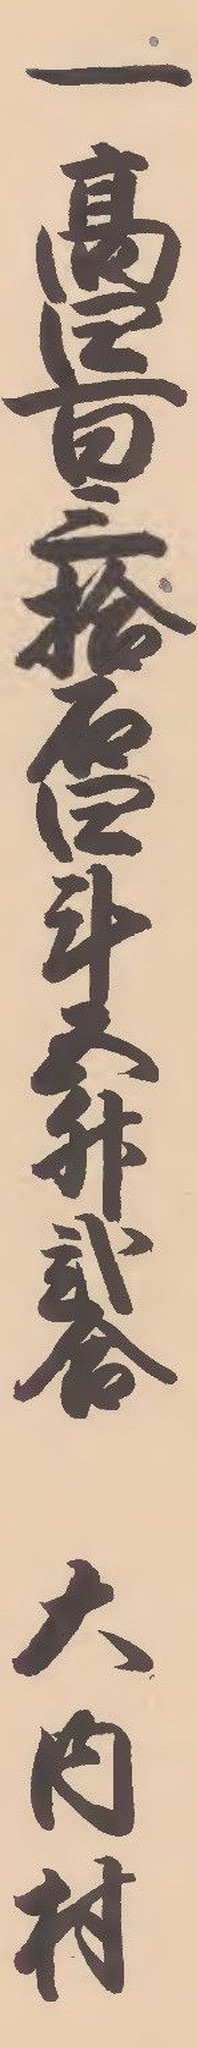一高四百三拾石四斗五升弐合大内村
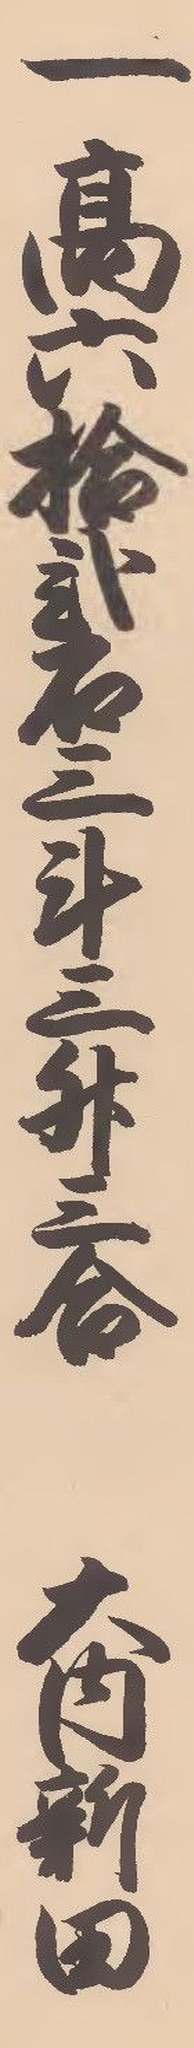一高六拾弐石三斗三升三合大内新田
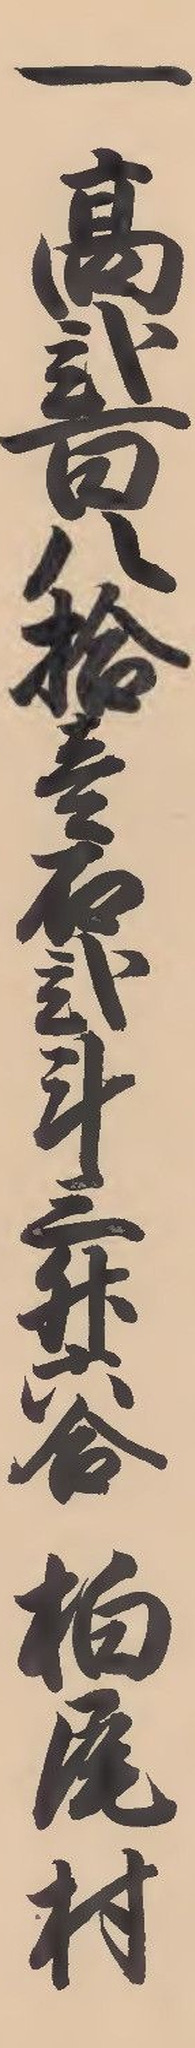一高弐百八拾壱石弐斗三升六合柏尾村
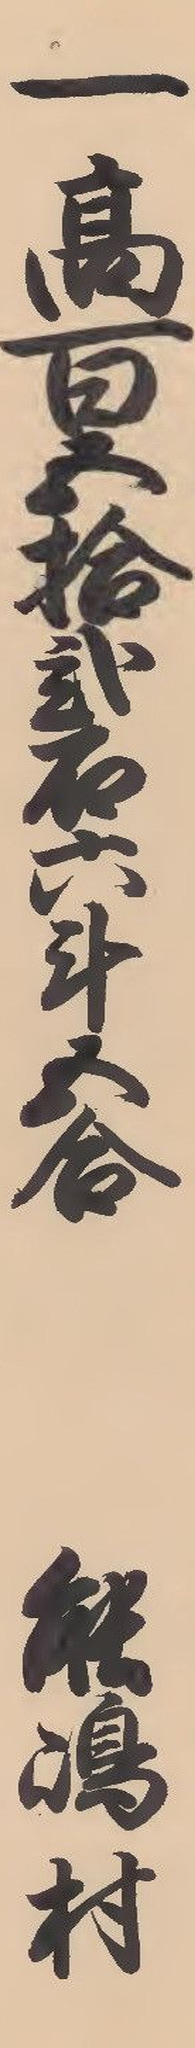一高百五拾弐石六斗五合能島村
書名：駿河国郷帳
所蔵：国立公文書館 National Archives of Japan
